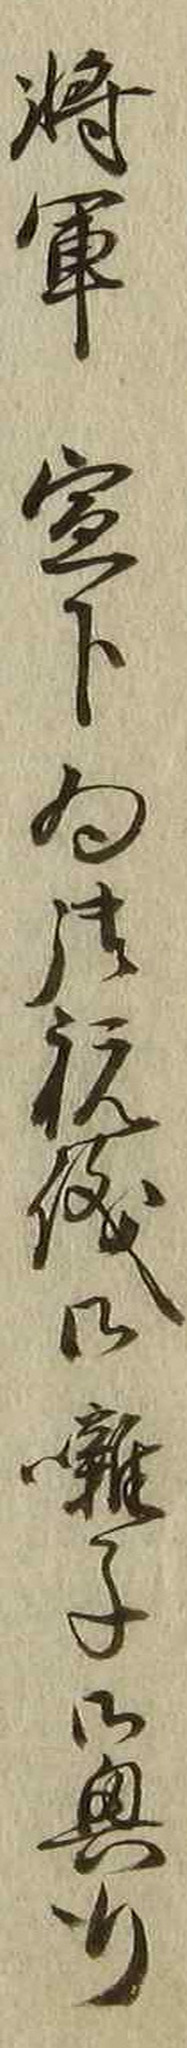将軍宣下為御祝儀御囃子御奥行
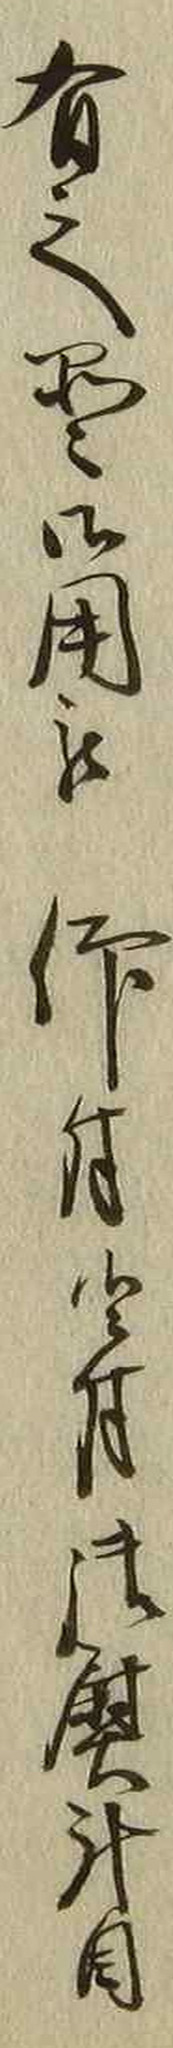有之品々御用被仰付候ニ付御熨斗目
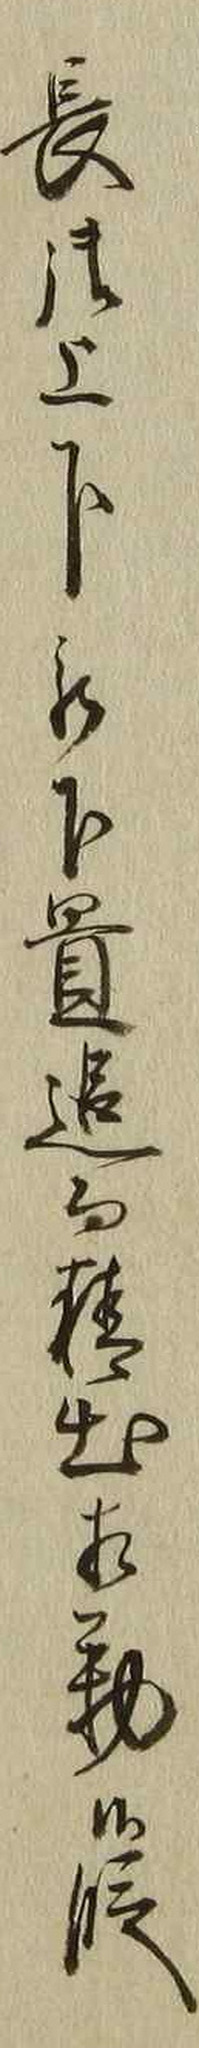長御上下被下置追而精出相勤候段
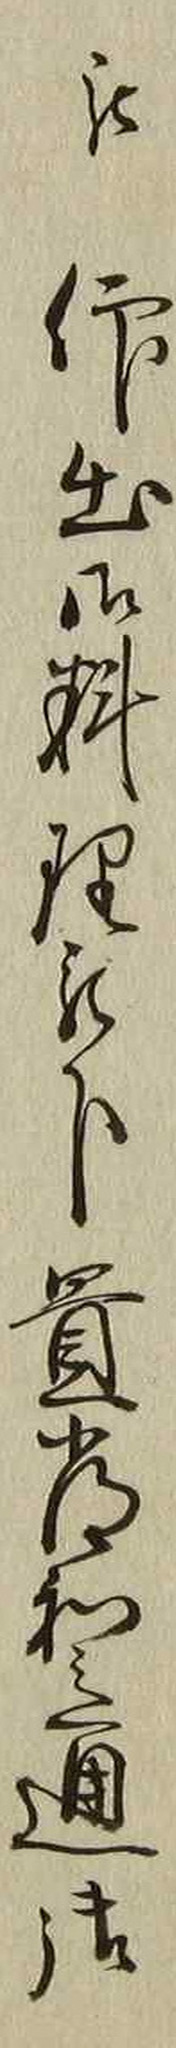被仰出御料理被下置常和之通御
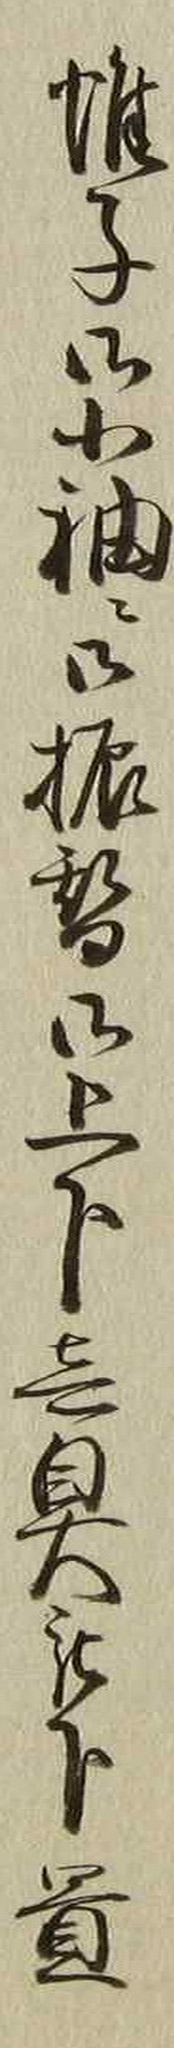帷子御小袖ニ振替御上下壱具被下置
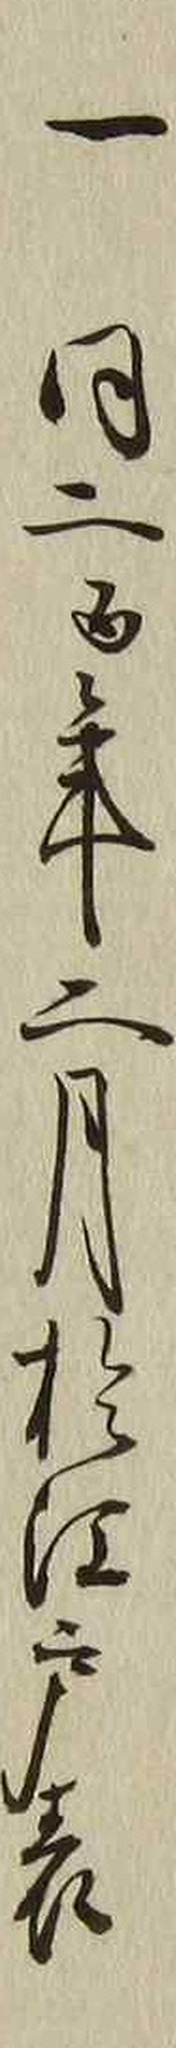一同二酉年二月於江戸表
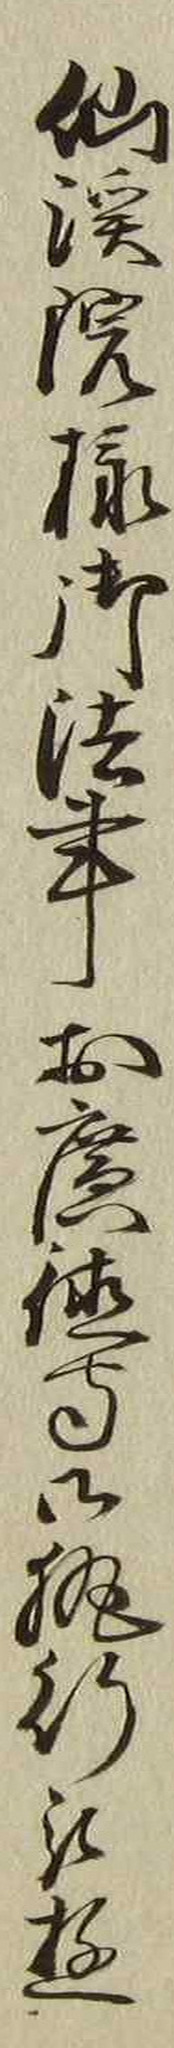仙渓院様御法事於廣徳寺御執行被遊
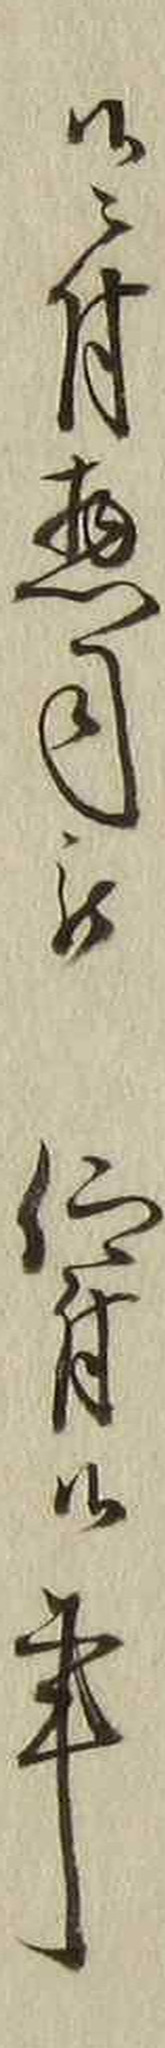候ニ付惣司被仰付候事
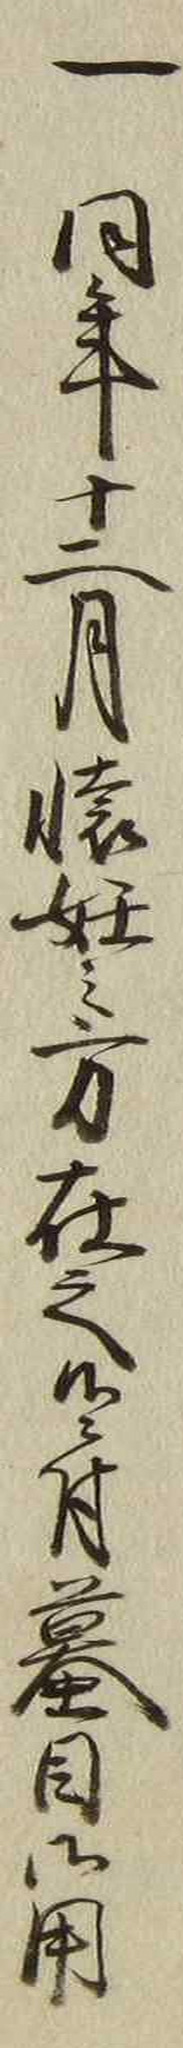一同年十二月懐妊之方在之候ニ付墓目御用
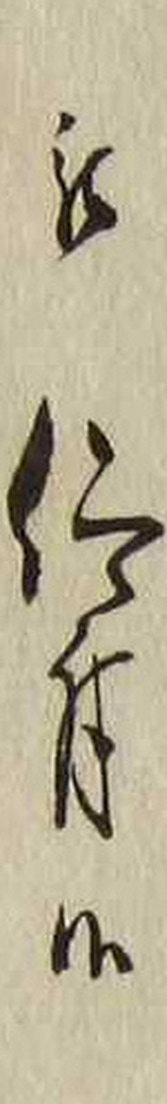被仰付候
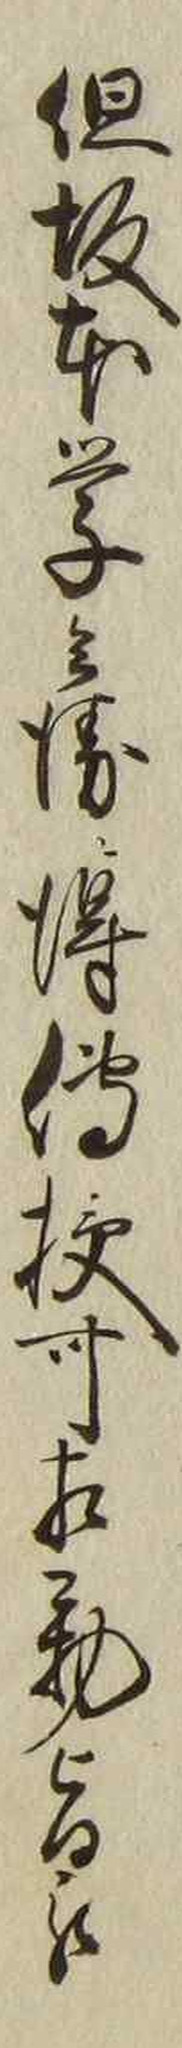但坂本学兵衛ニ得傳授可相勤旨被
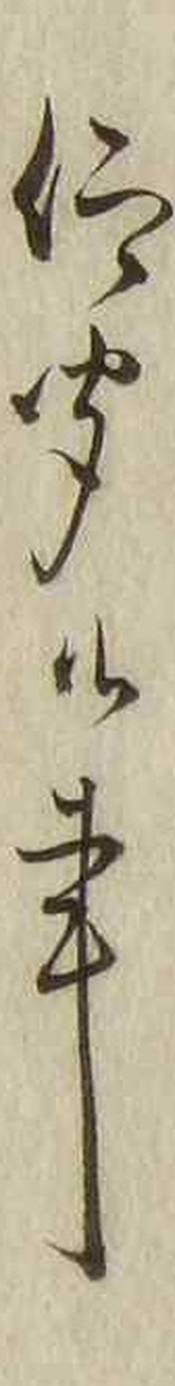伝聞候事

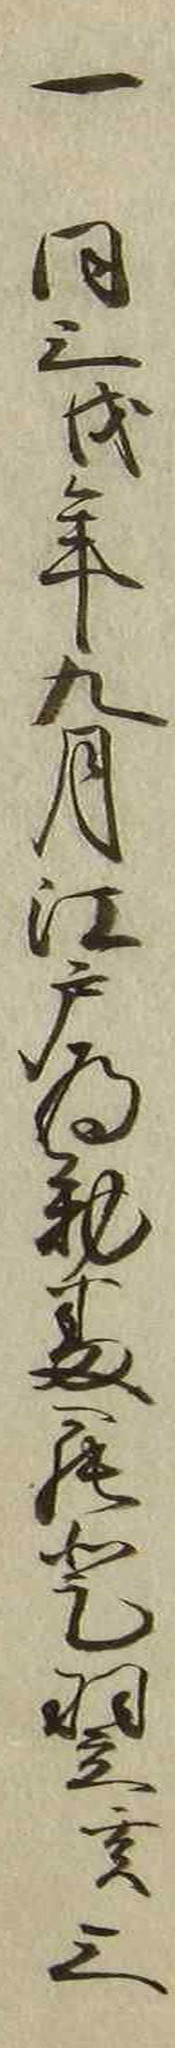一同三戌年九月江戸為勤番罷登翌亥三
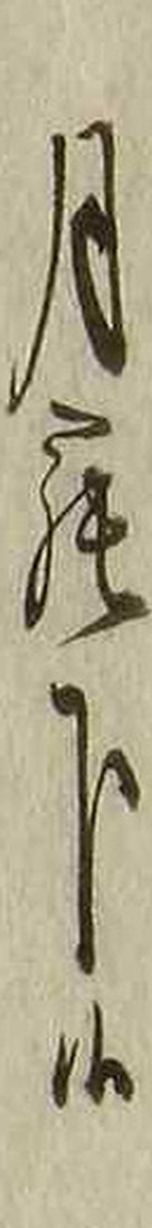月罷下候
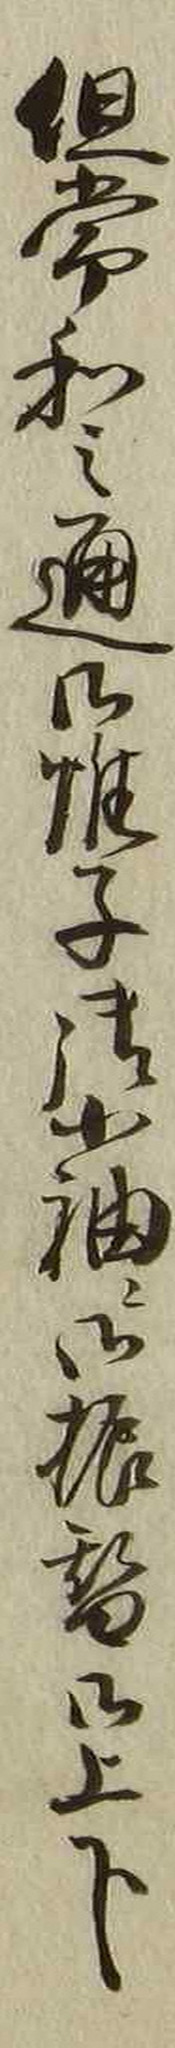但常和之通御帷子御小袖ニ御振替御上下
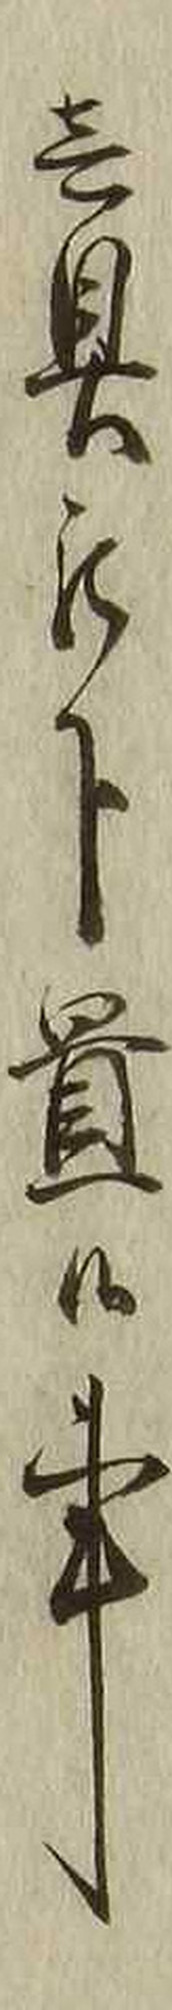壱具被下置候事
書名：諸士系譜　巻之65　ち之部1
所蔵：会津若松市立会津図書館
